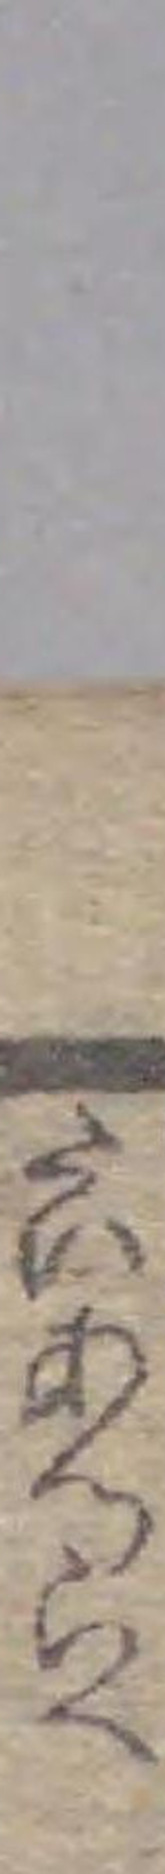たいあつらへ
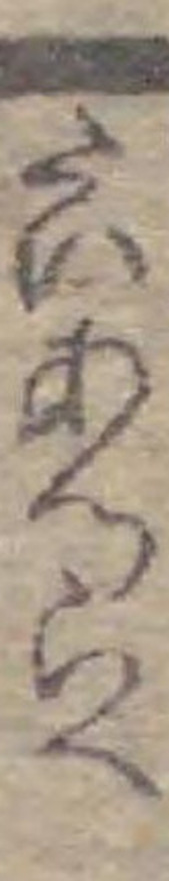たいあつらへ
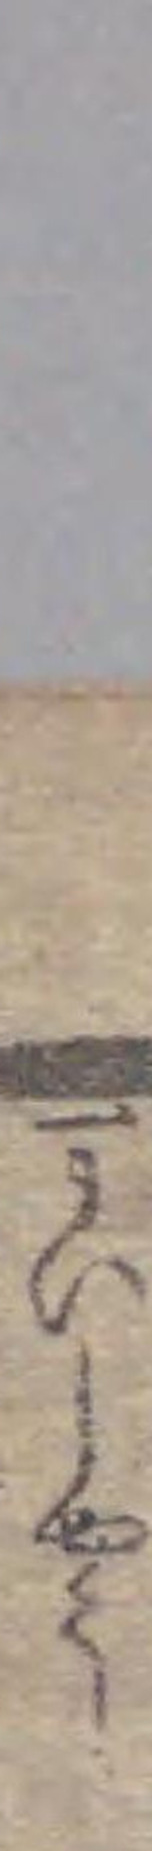すいしやう
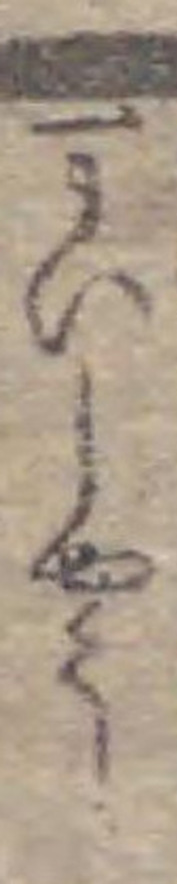すいしやう
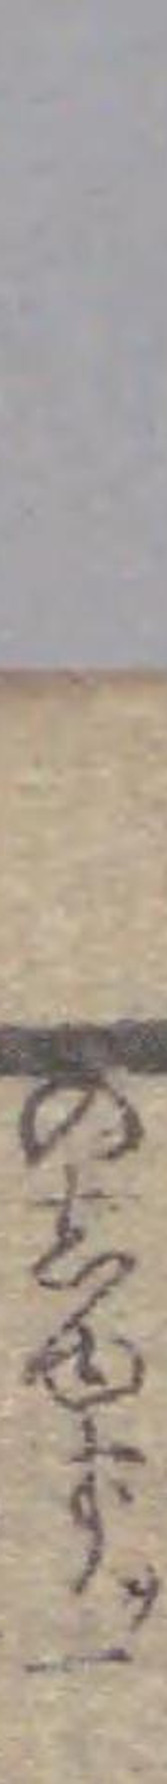のしゆすを一
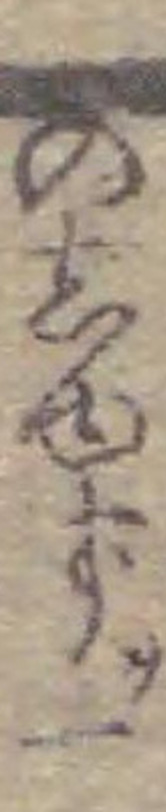のしゆすを一
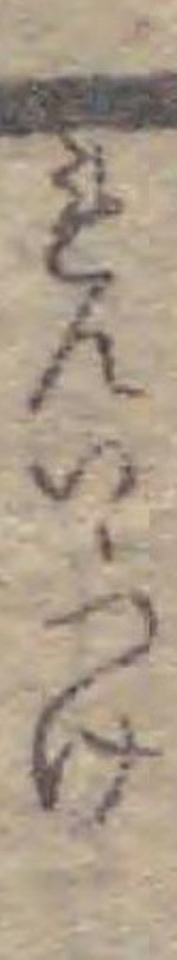れんいゝつけ
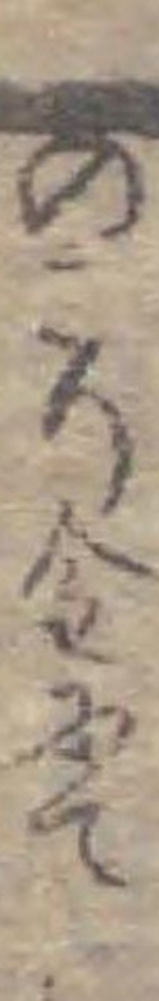のこり金にて
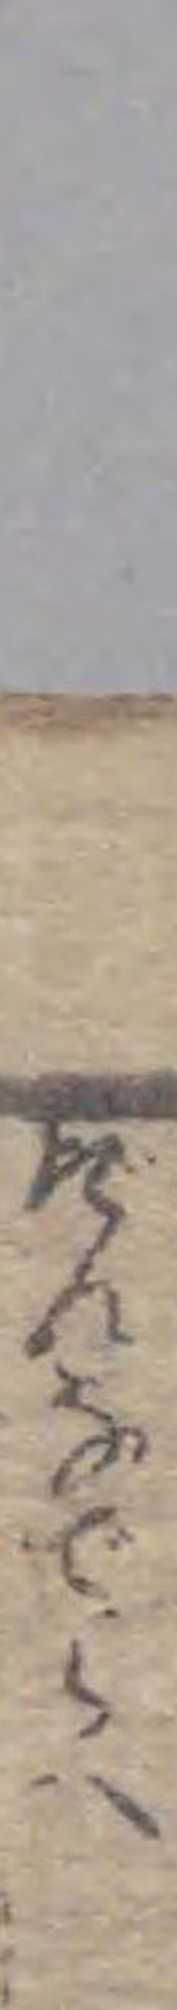だんなでらへ
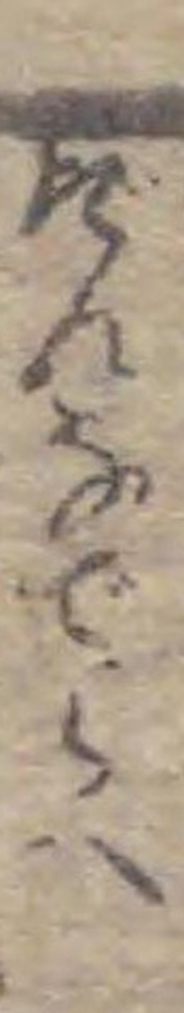だんなでらへ
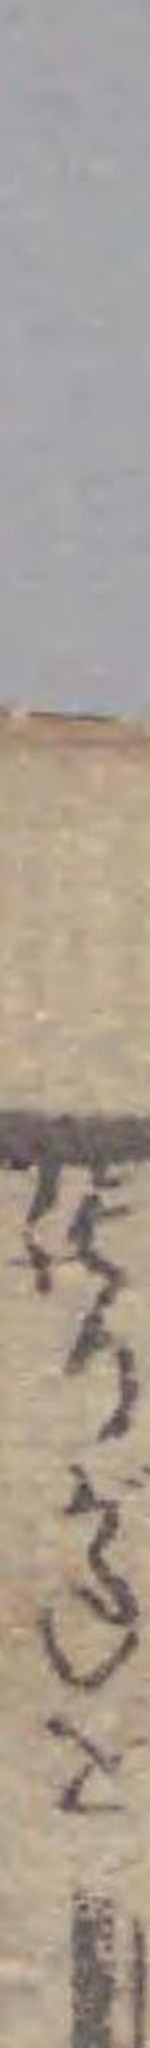つりがねを
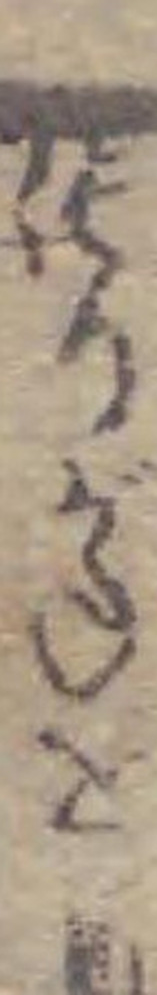つりがねを
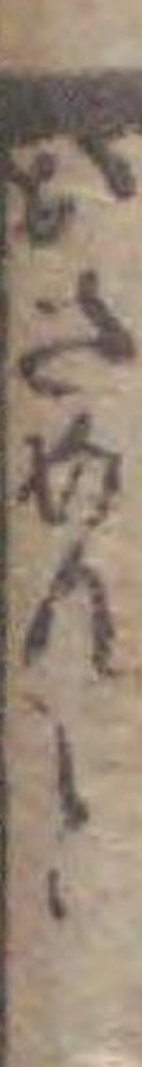おさめんと
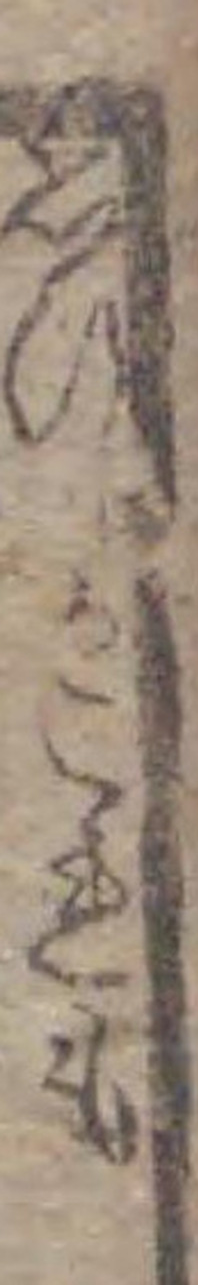思ひしかこれも
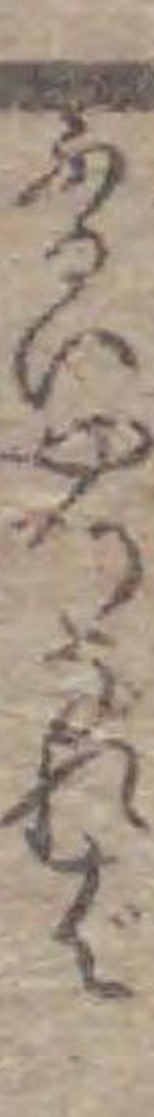ふるいやつなれば
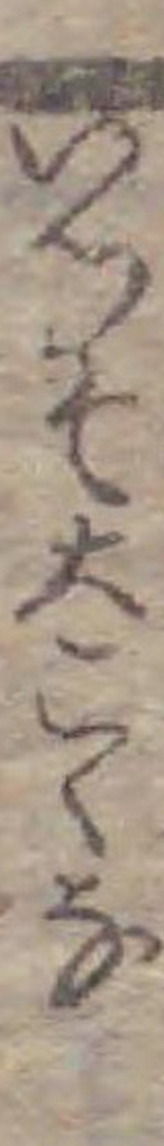いつそ大こくな
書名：紺屋百物語 : 3巻
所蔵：国立国会図書館 National Diet Library, JAPAN
